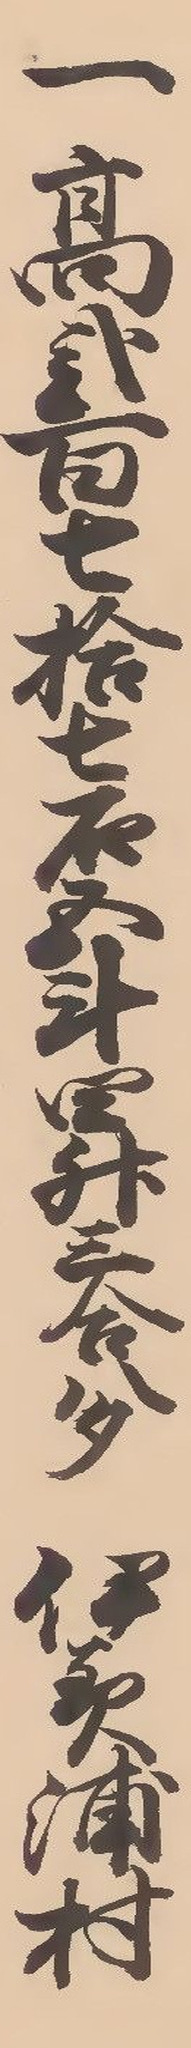一高弐百七拾七石五斗四升三合八勺伊美浦村
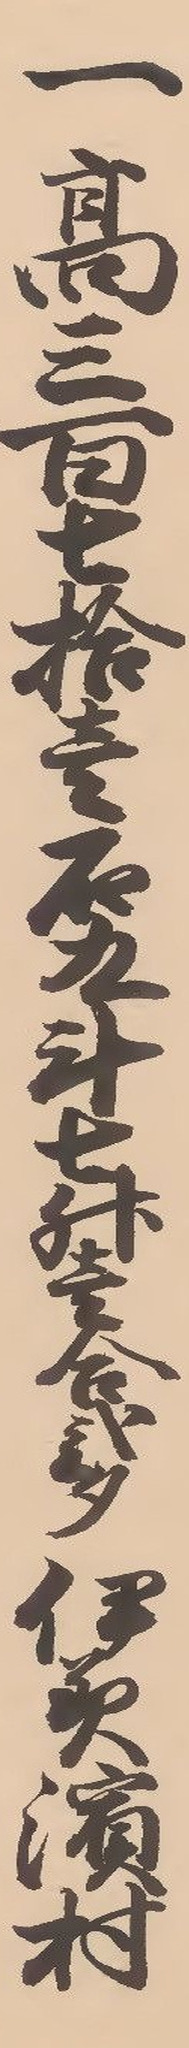一高三百七拾壱石九斗七升壱合弐勺伊美浜村
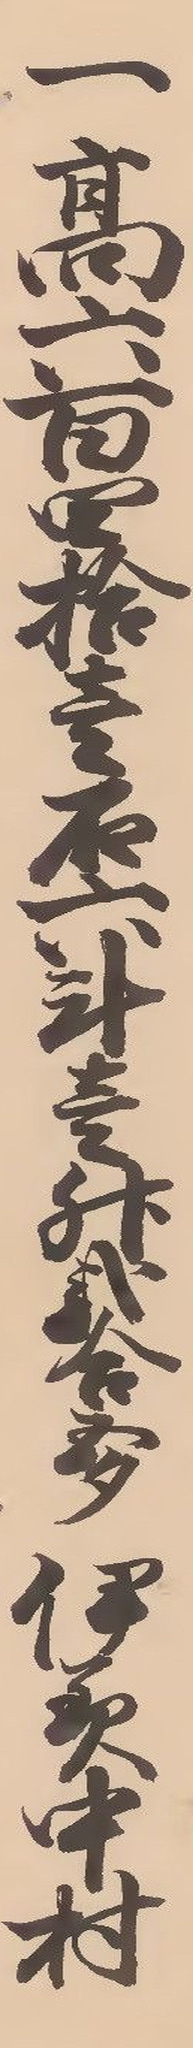一高六百四拾壱石六斗壱升弐合五勺伊美中村
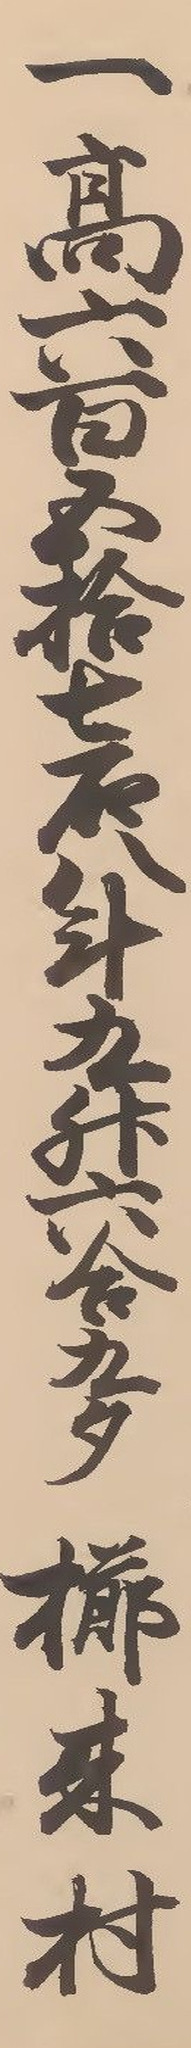一高六百五拾七石八斗九升六合九勺櫛来村
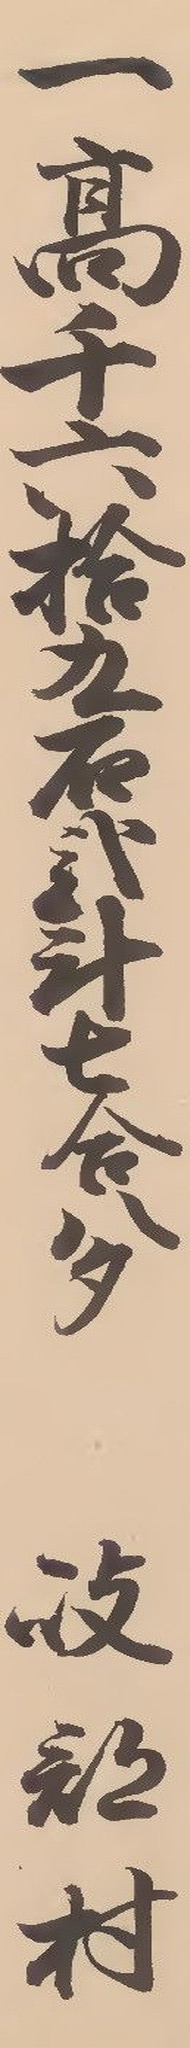一高千六拾九石弐斗七合八勺岐部村
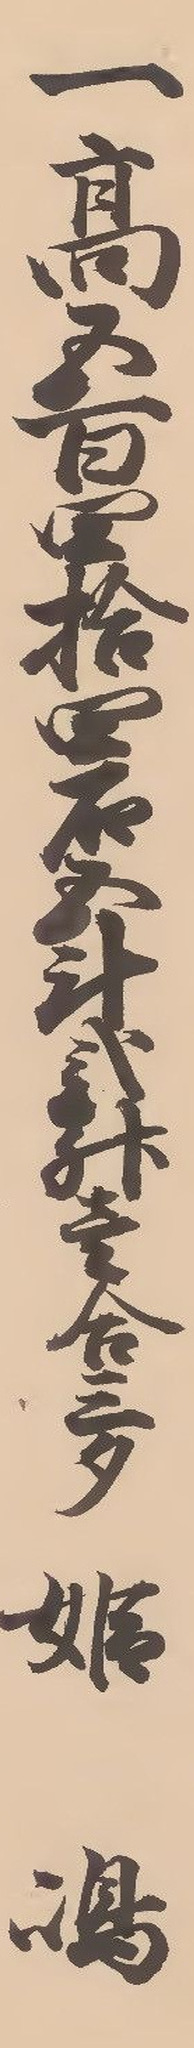一高五百四拾四石五斗弐升壱合三勺姫島
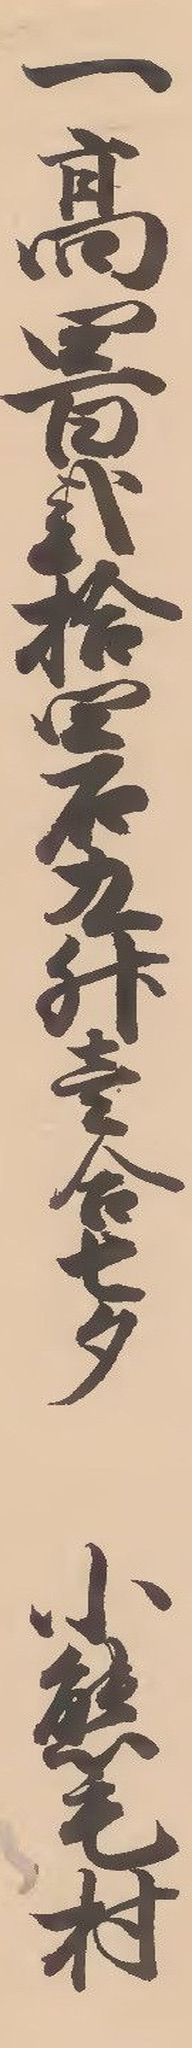一高四百弐拾四石九升壱合七勺小熊毛村

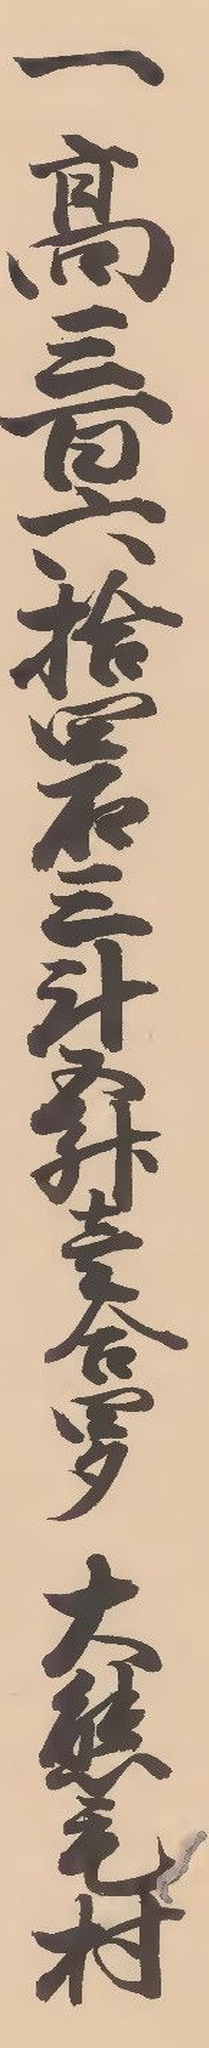一高三百六拾四石三斗五升壱合四勺大熊毛村
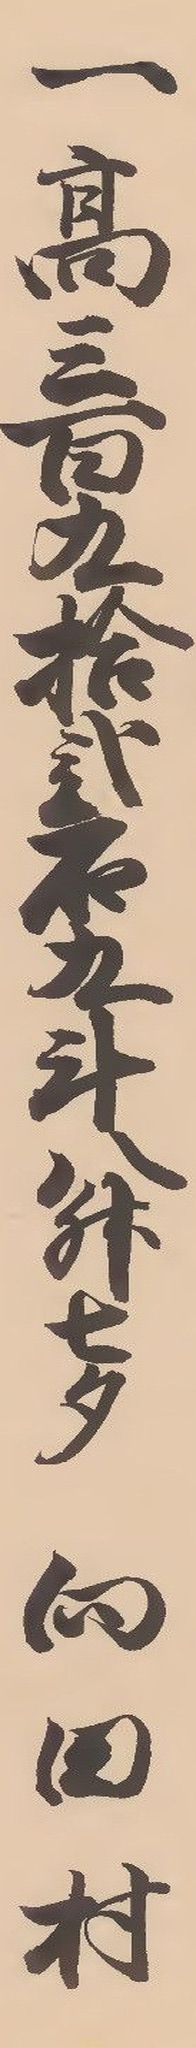一高三百九拾弐石九斗八升七勺向田村
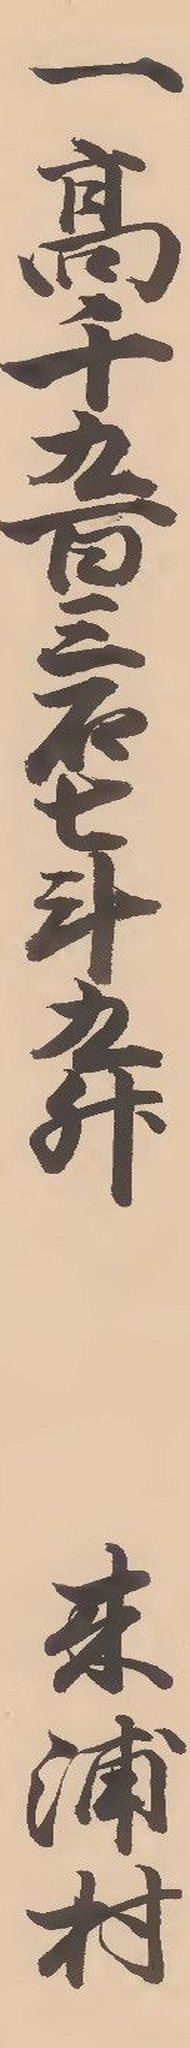一高千九百三石七斗九升来浦村
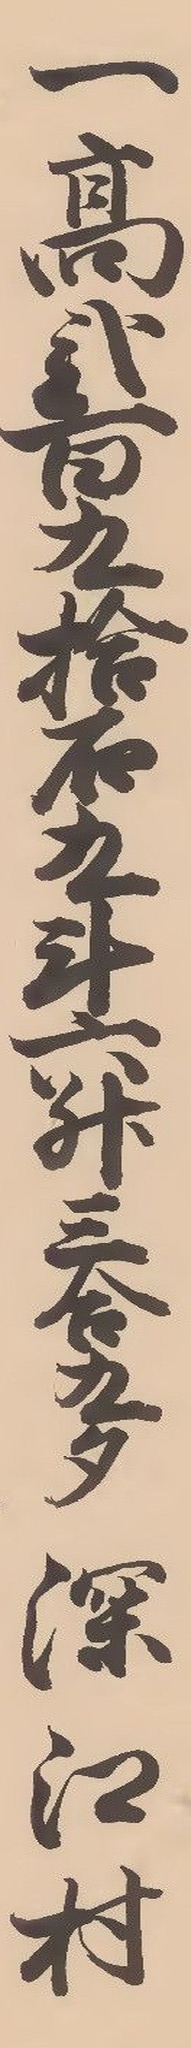一高弐百九拾石九斗六升三合九勺深江村
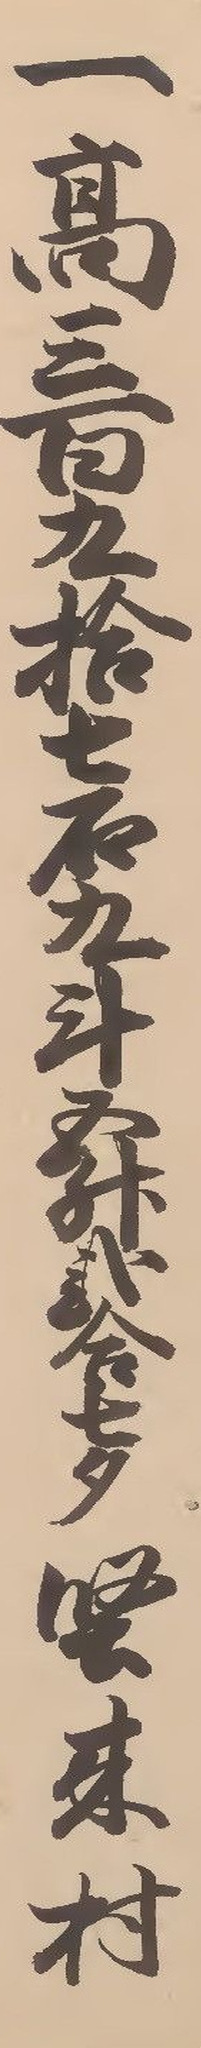一高三百九拾七石九斗五升弐合七勺堅来村
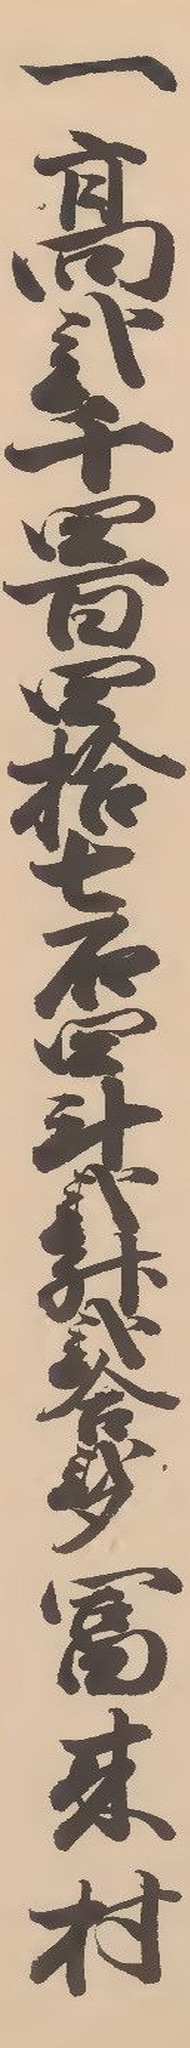一高弐千四百四拾七石四斗弐升弐合弐勺富来村
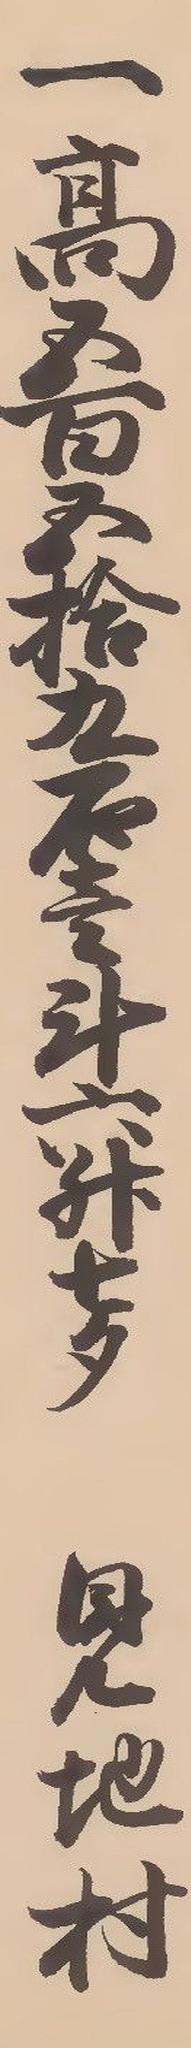一高五百五拾九石壱斗六升七勺見地村
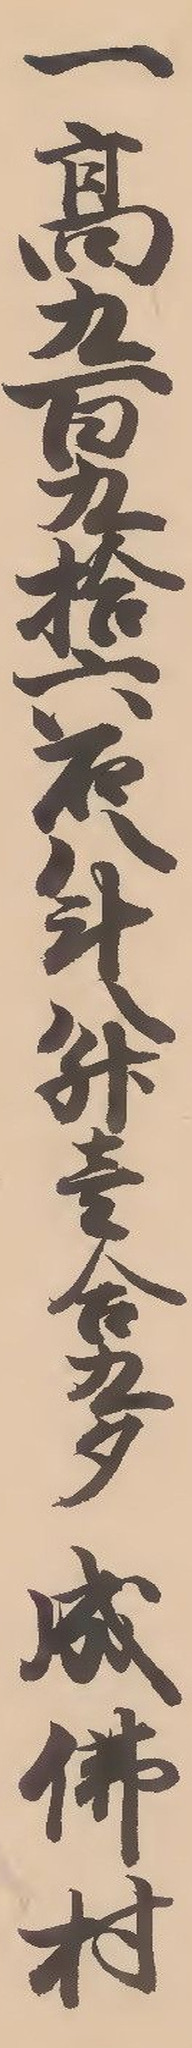一高九百九拾六石八斗八升壱合九勺成仏村

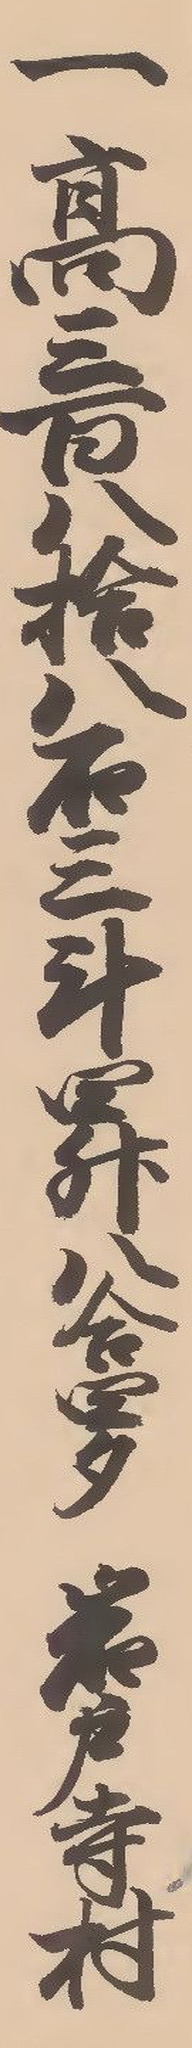一高三百八拾八石三斗四升八合四勺岩戸寺村
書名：豊後国郷帳
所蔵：国立公文書館 National Archives of Japan
